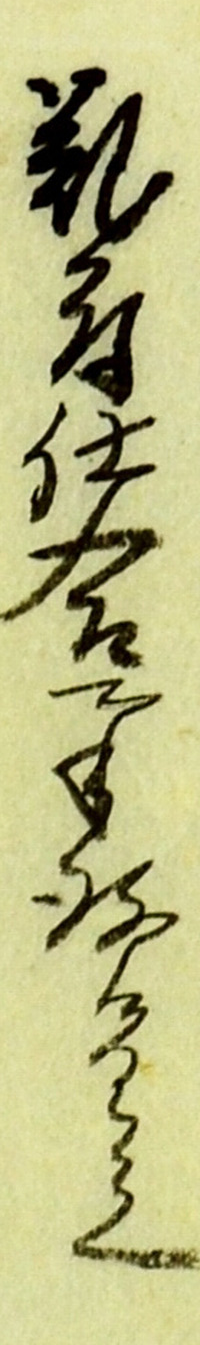難有仕合奉存候以上
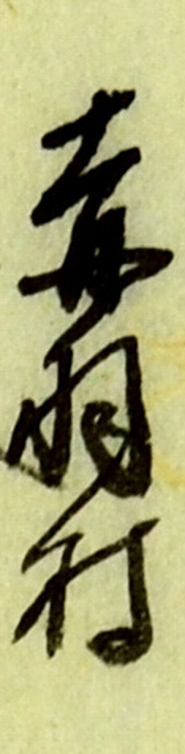赤羽村
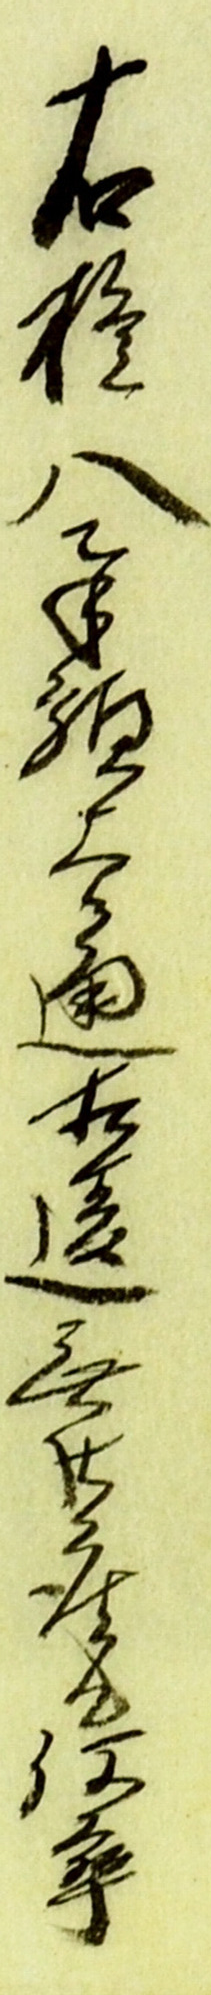右権八奉願上候通相違無御座候何卒
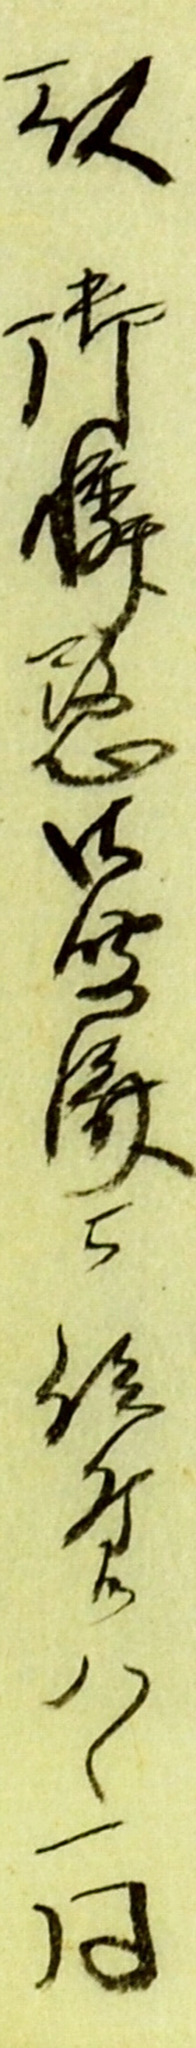以御憐愍御聞済被仰付候ハゝ一同
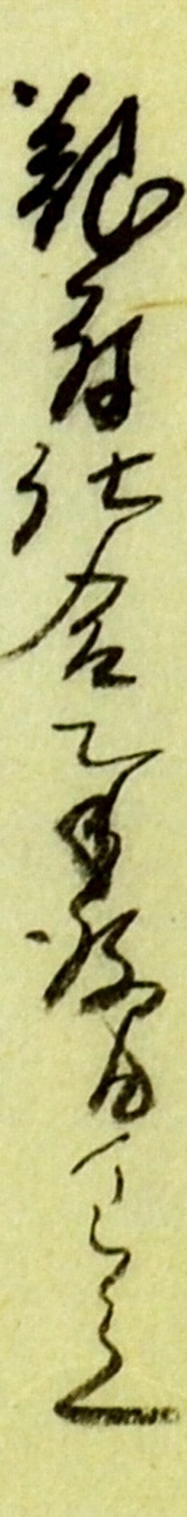難有仕合奉存候以上
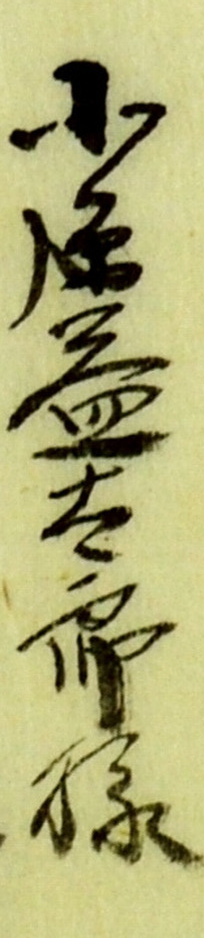北原益太郎様
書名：諸願書留
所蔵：伊那市立高遠町図書館・合同会社AMANE
